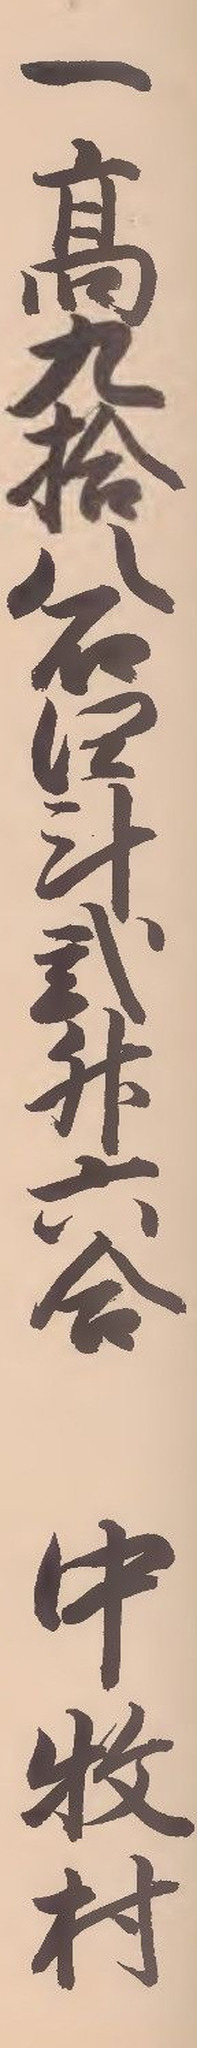一高九拾八石四斗弐升六合中枚村
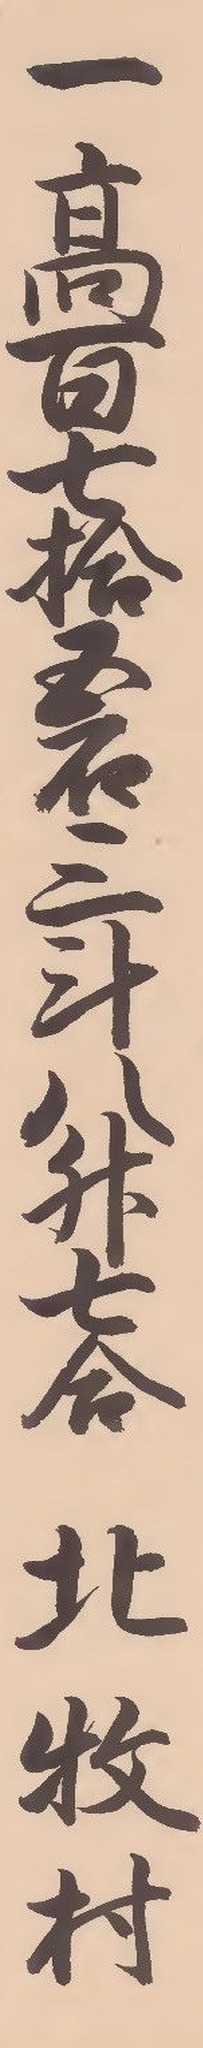一高百七拾五石三斗八升七合北枚村
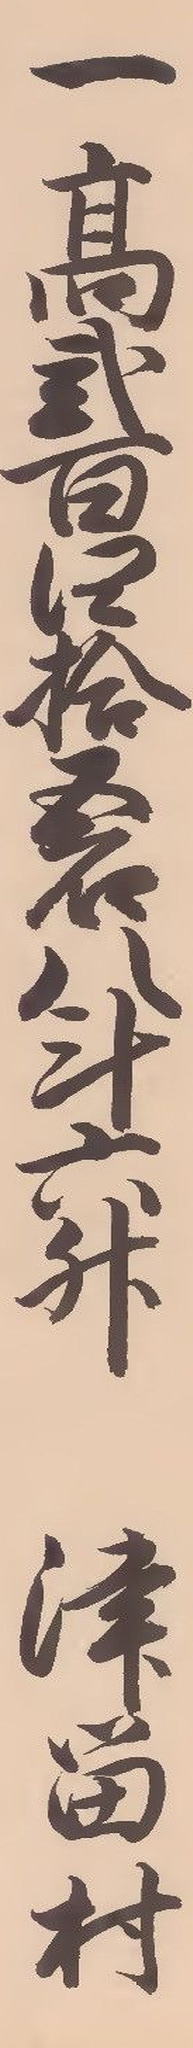一高弐百四拾五石八斗六升津留村
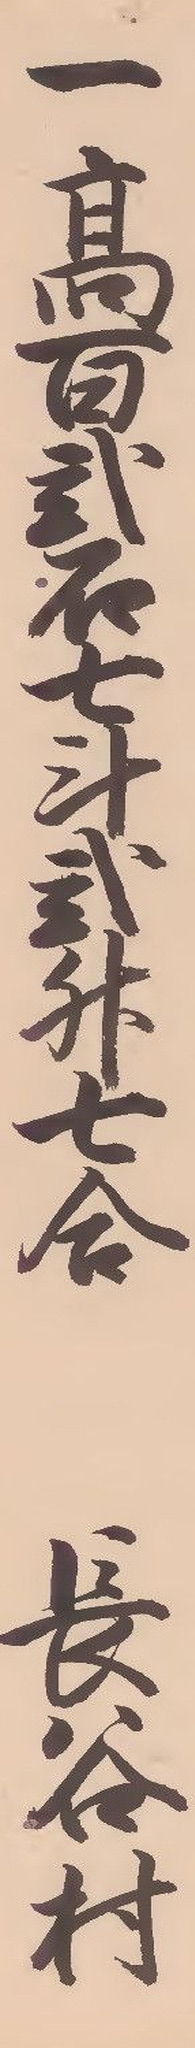一高百弐石七斗弐升七合長谷村

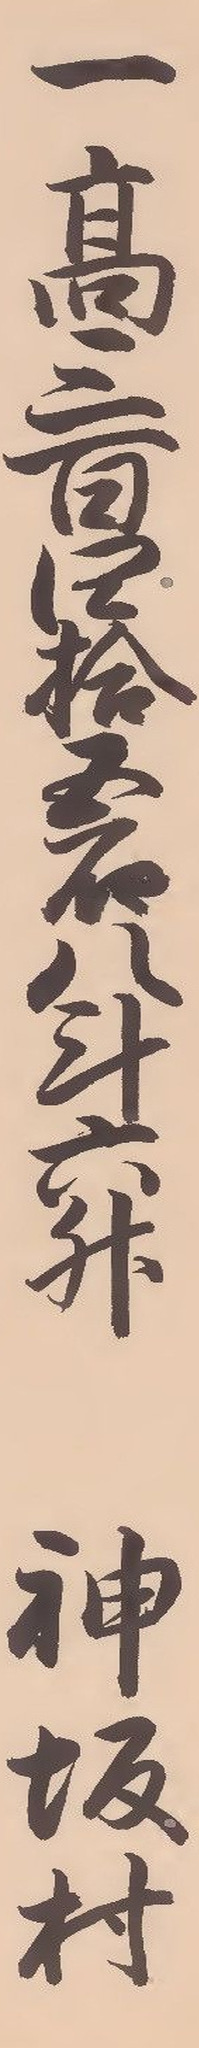一高三百四拾五石八斗六升神坂村
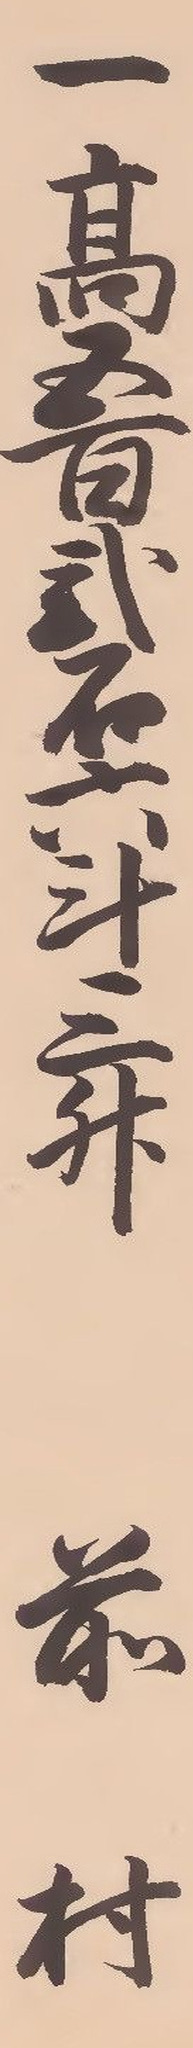一高五百弐石六斗三升前村
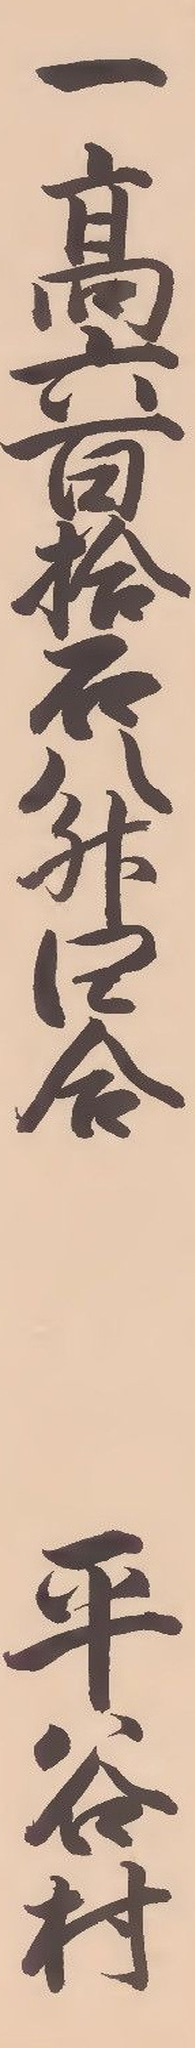一高六百拾石八升四合平谷村
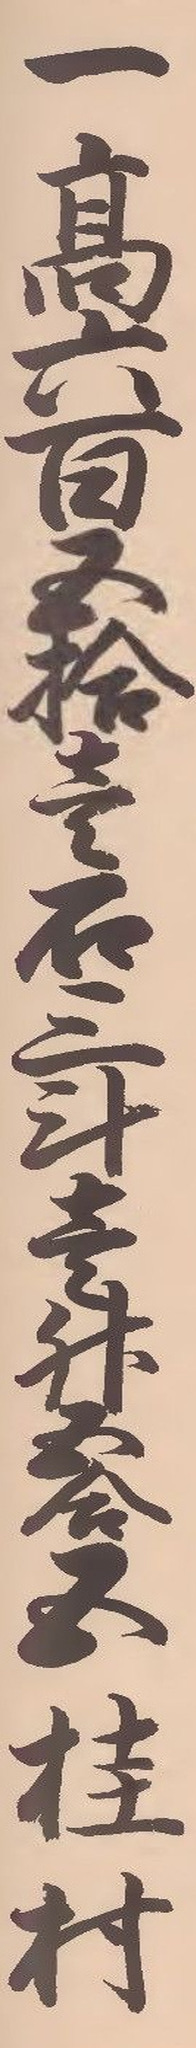一高六百五拾壱石三斗壱升五合五桂村
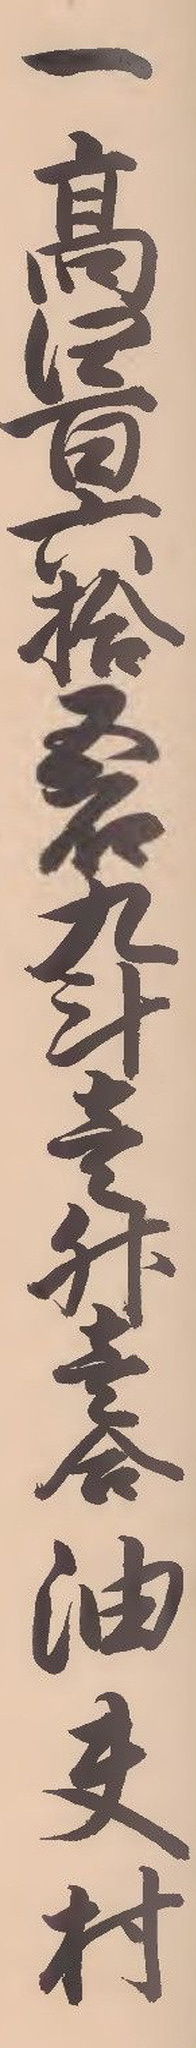一高四百六拾五石九斗壱升壱合油夫村
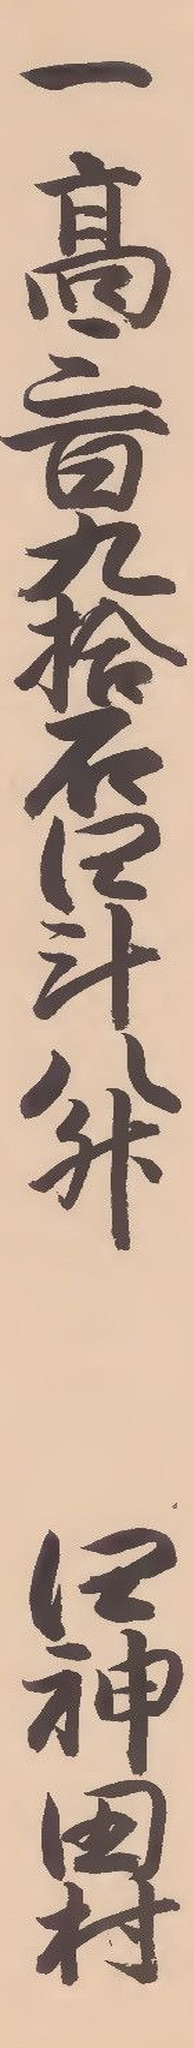一高三百九拾石四斗八升四神田村
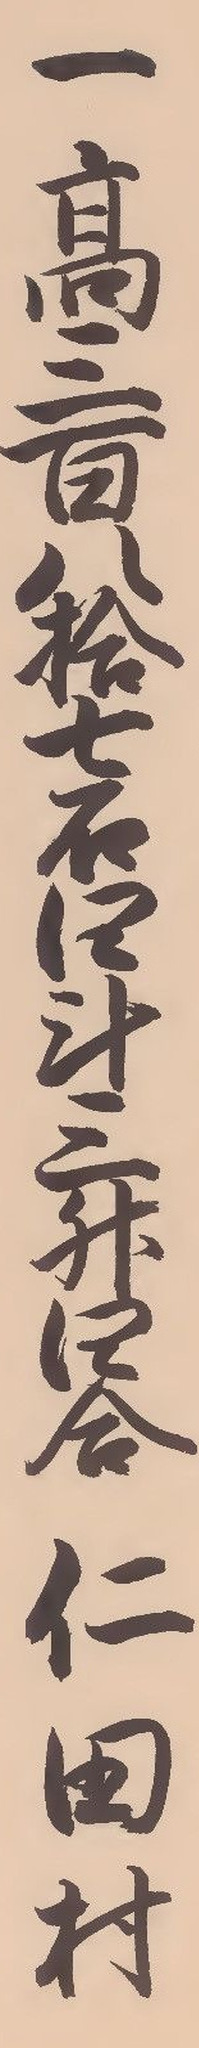一高三百八拾七石四斗三升四合仁田村
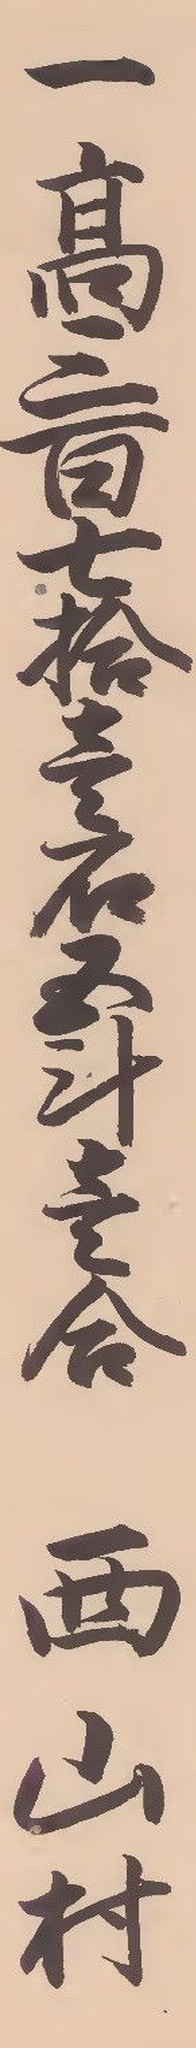一高三百七拾壱石五斗壱合西山村

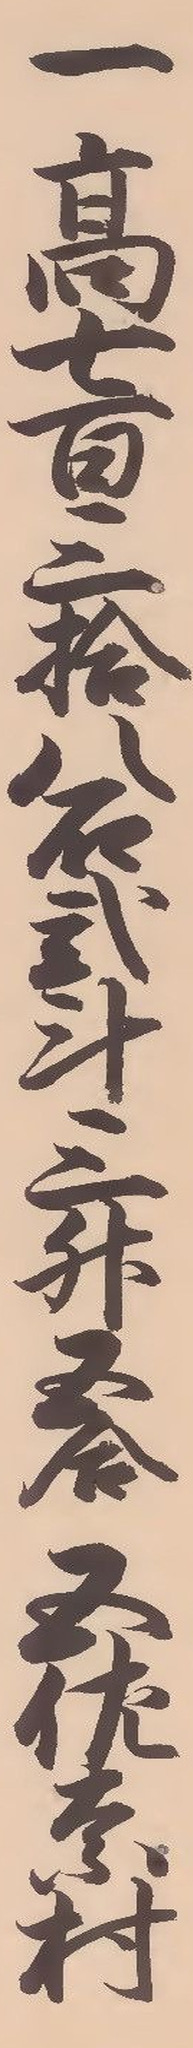一高七百三拾八石弐斗三升五合五佐奈村
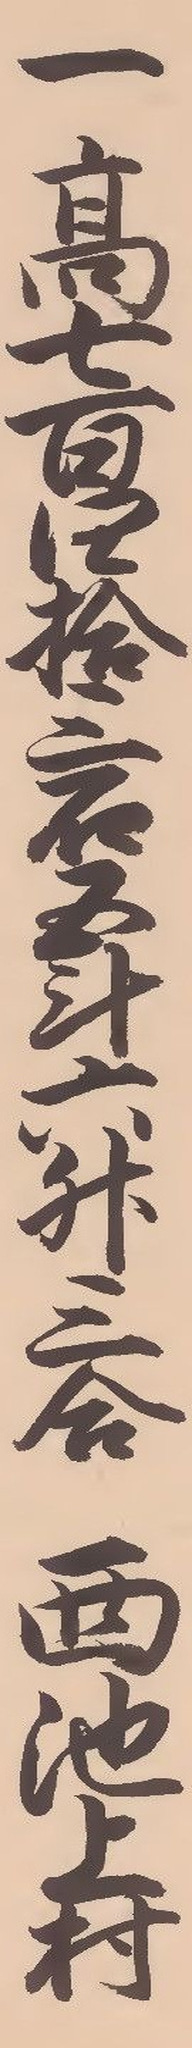一高七百四拾三石五斗六升三合西池上村
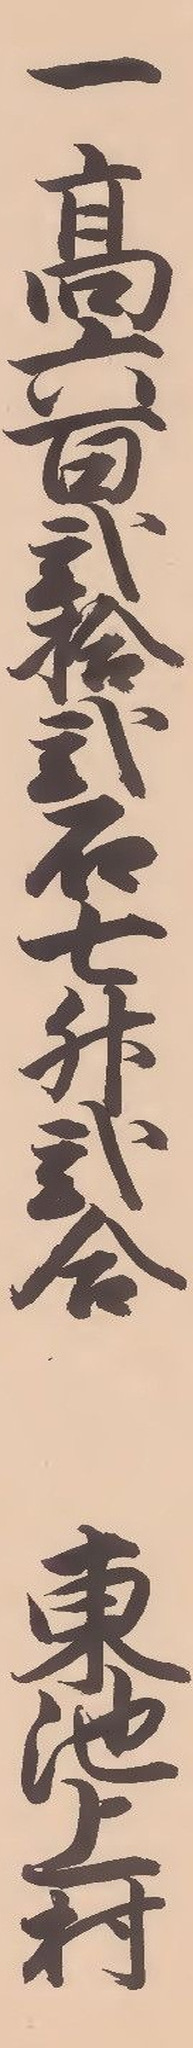一高六百弐拾弐石七升弐合東池上村
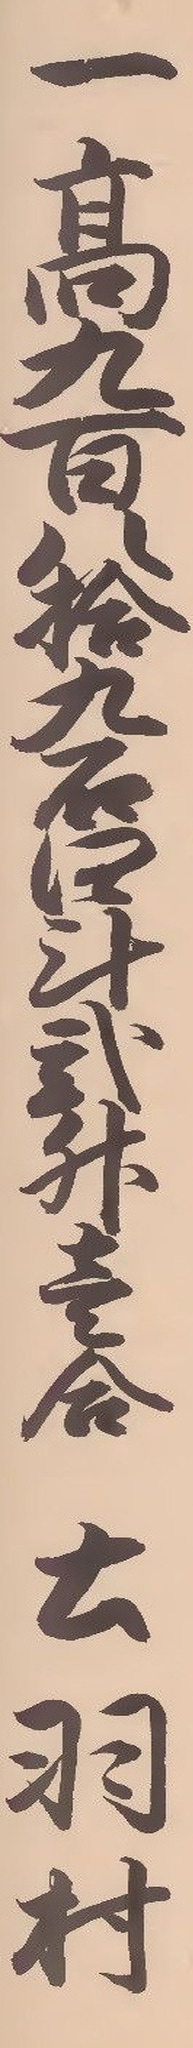一高九百八拾九石四斗弐升壱合土羽村
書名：伊勢国郷帳
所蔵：国立公文書館 National Archives of Japan
